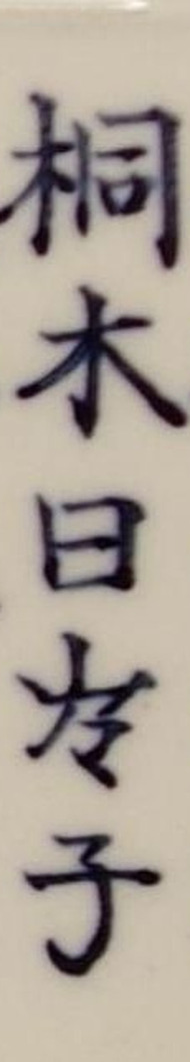桐木日出子
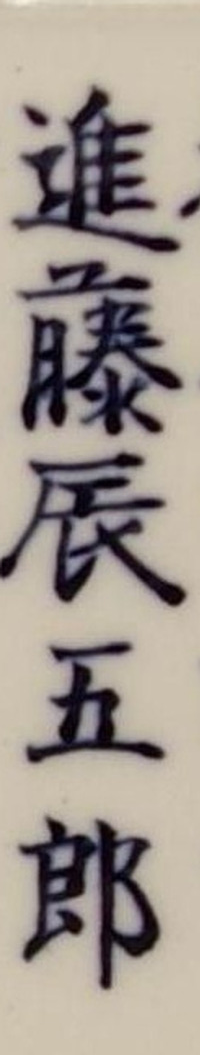進藤辰五郎
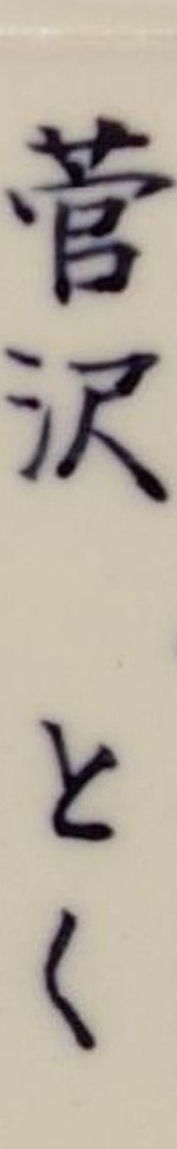菅沢とく
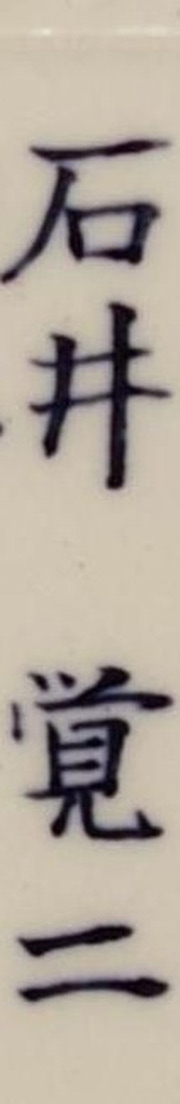石井覚二
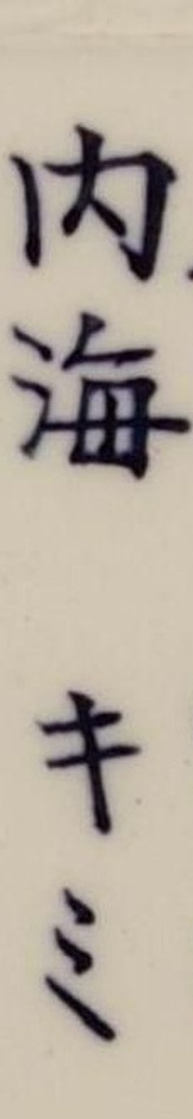内海キミ
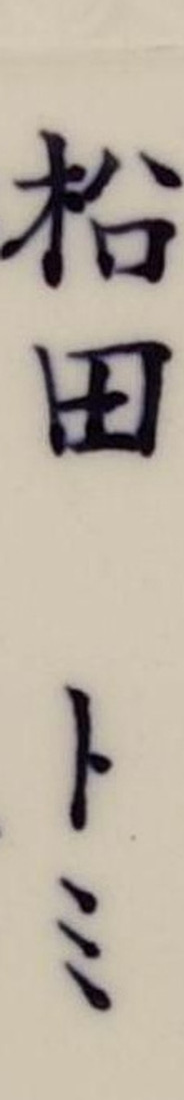松田トミ
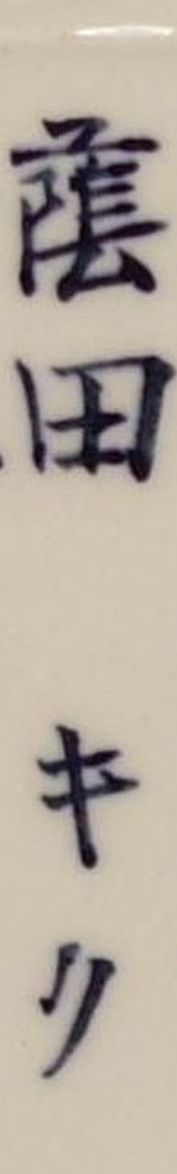蔭田キク
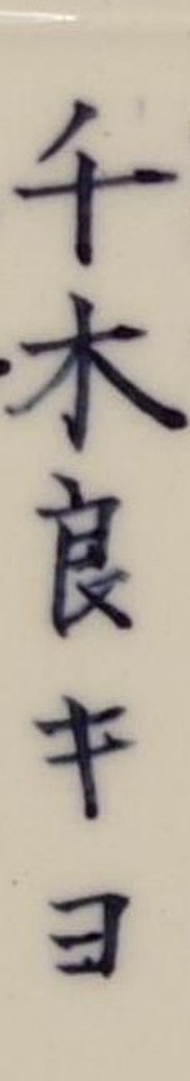千木良キヨ
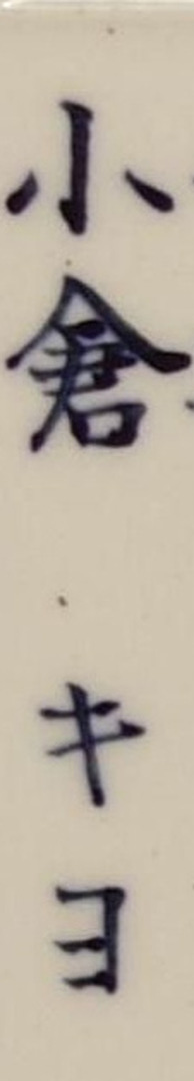小倉キヨ
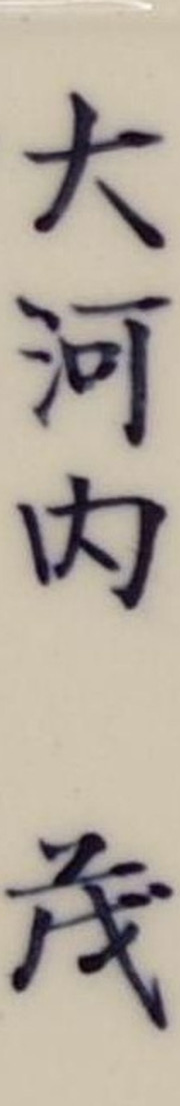大河内茂
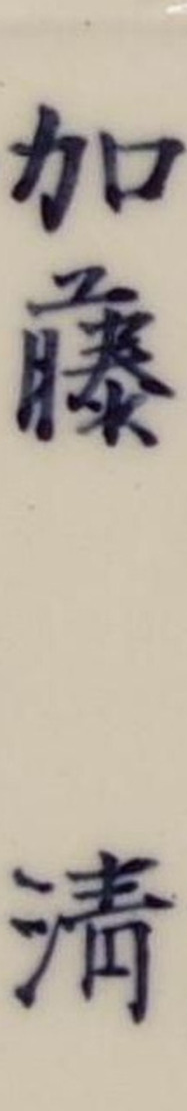加藤清
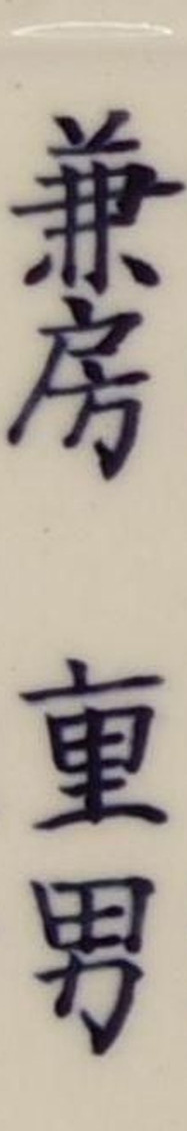兼房重男
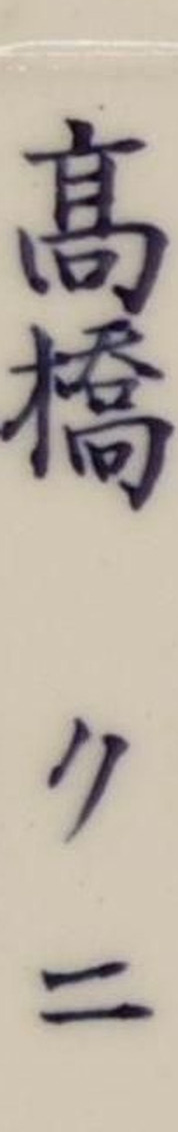高橋ク二
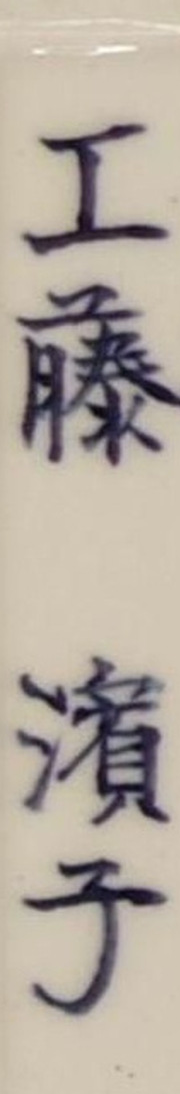工藤濱子

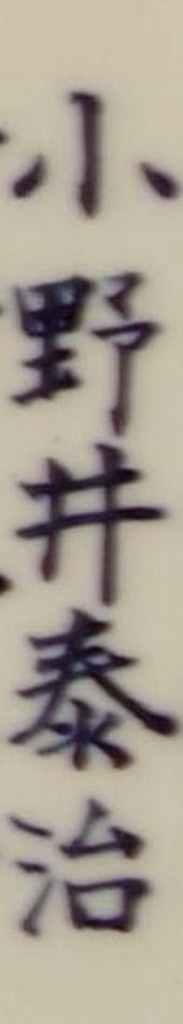小野井泰治
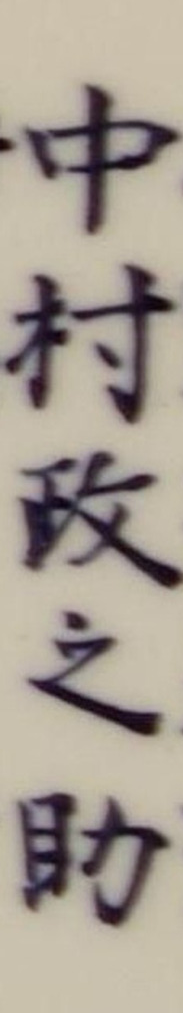中村政之助
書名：M~S
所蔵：高野山金剛峯寺
